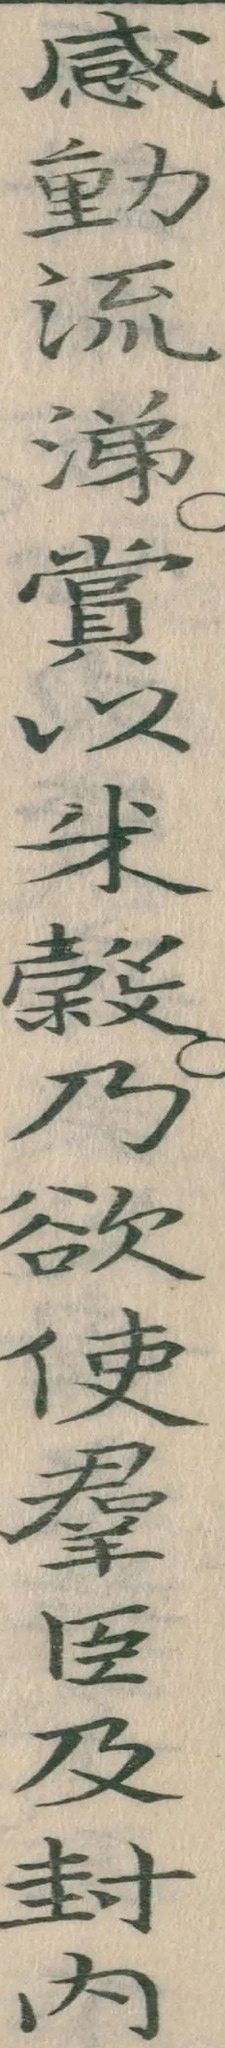感動流涕。賞以米穀。乃欲使群臣及封内
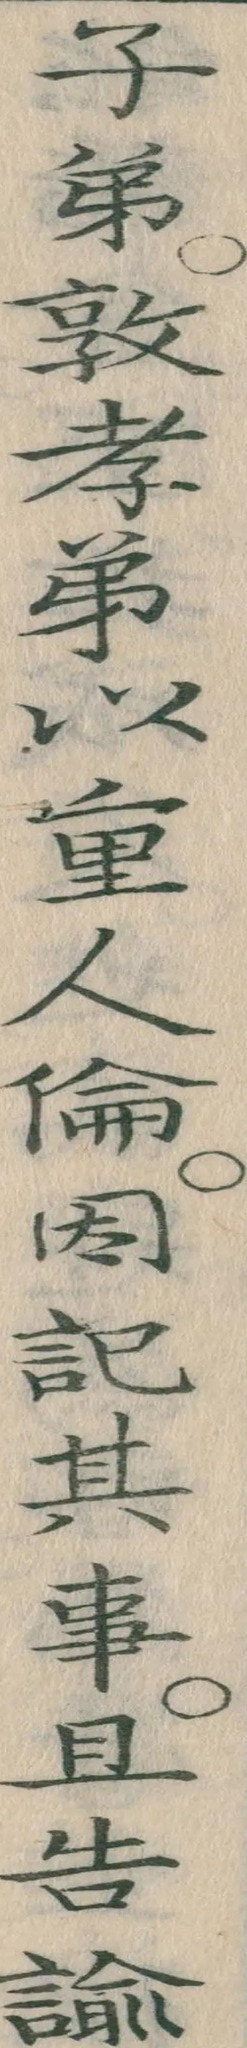子弟。敦孝弟以重人倫。因記其事。且告諭
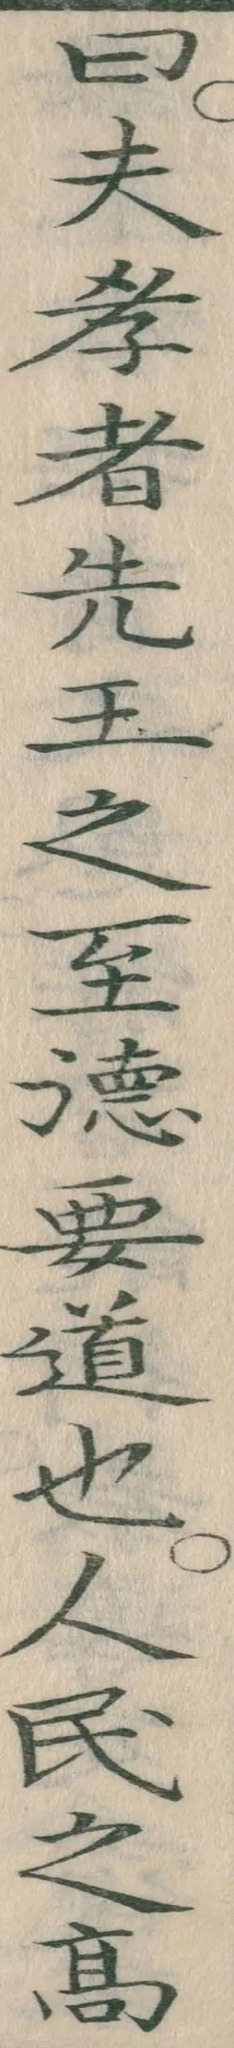曰。夫孝者先王之至徳要道也。人民之髙
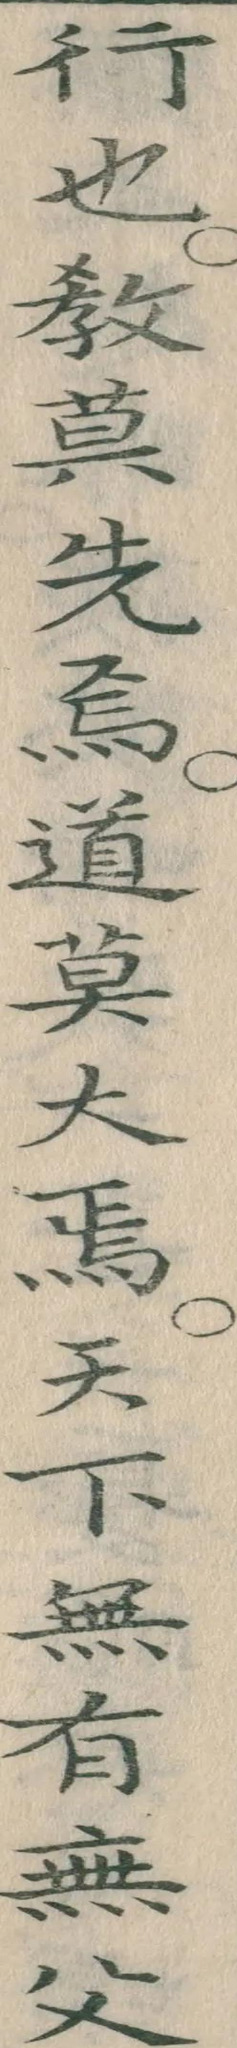行也。教莫先焉。道莫大焉。天下無有無父
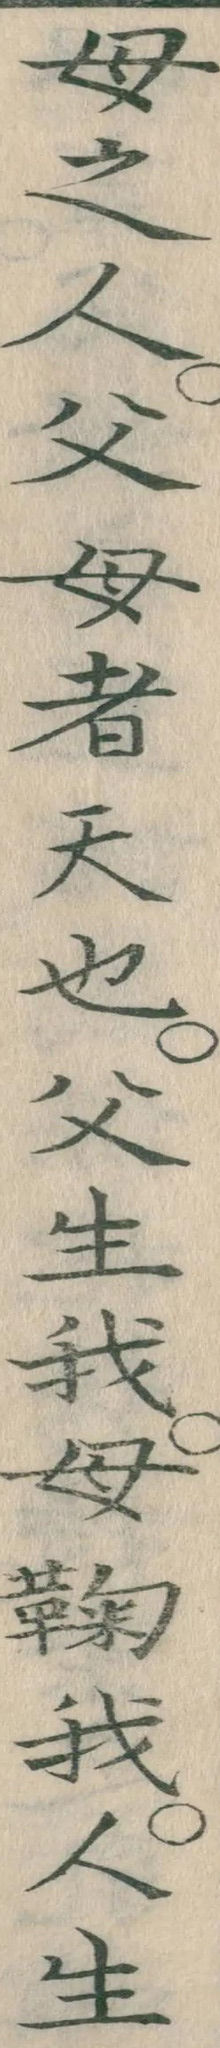母之人。父母者天也。父生我。母鞠我。人生
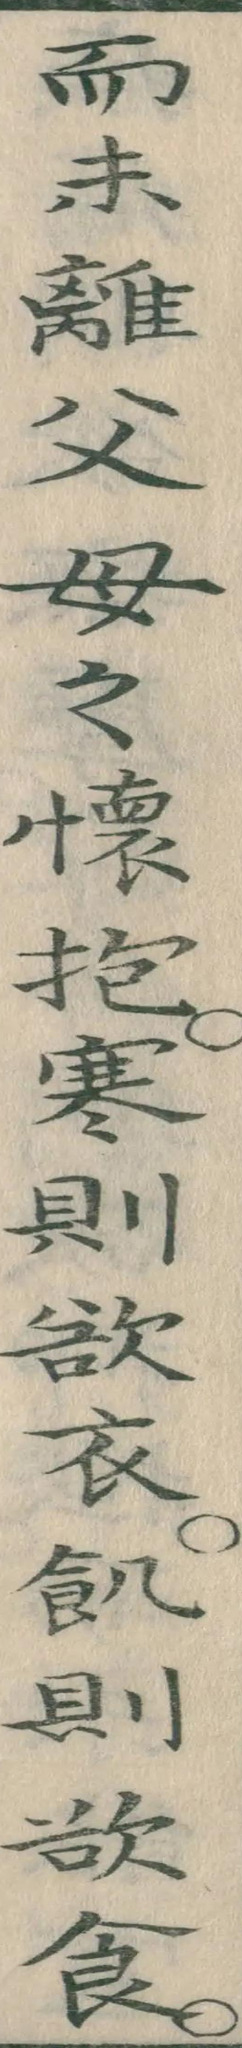而未離父母之懐抱。寒則欲衣。飢則欲食。

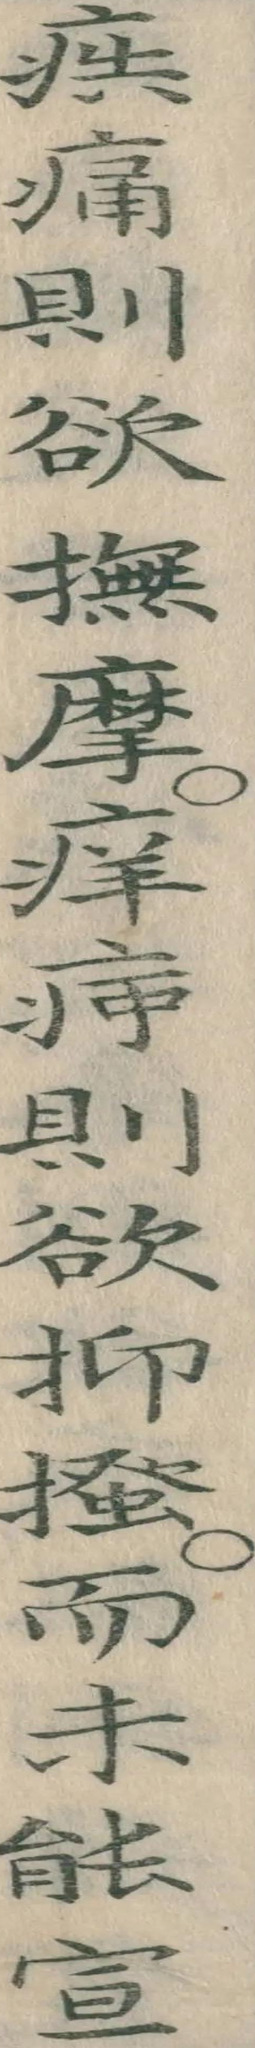疾痛則欲撫摩。痒則欲抑掻。而未能宣
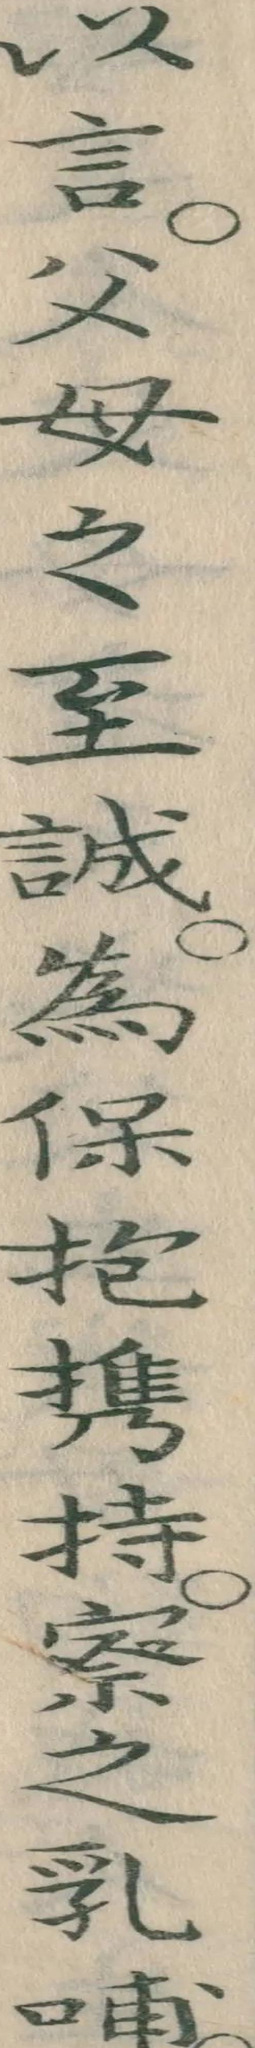以言。父母之至誠。為保抱携持。察之乳晡
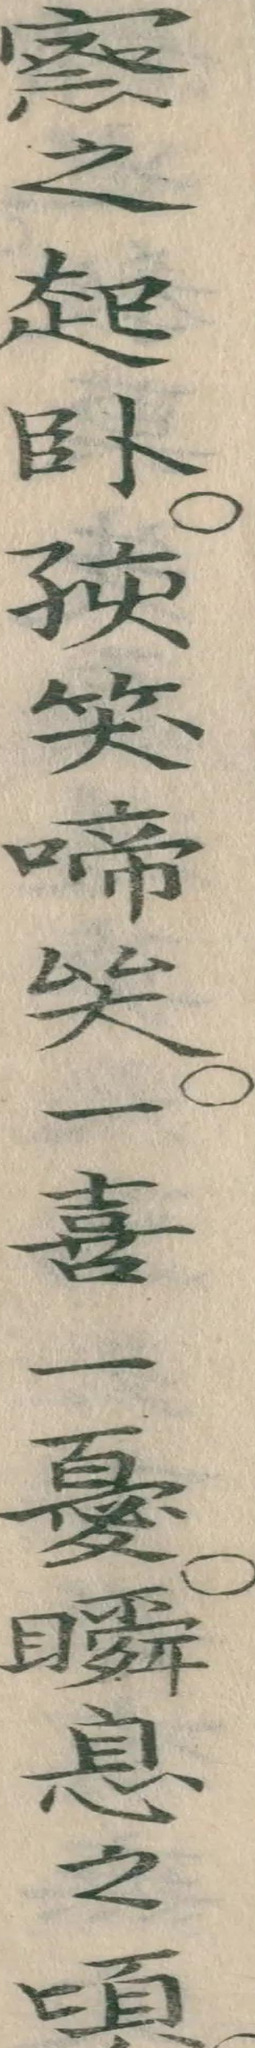察之起臥。孩笑啼笑。一喜一憂。瞬息之頃。
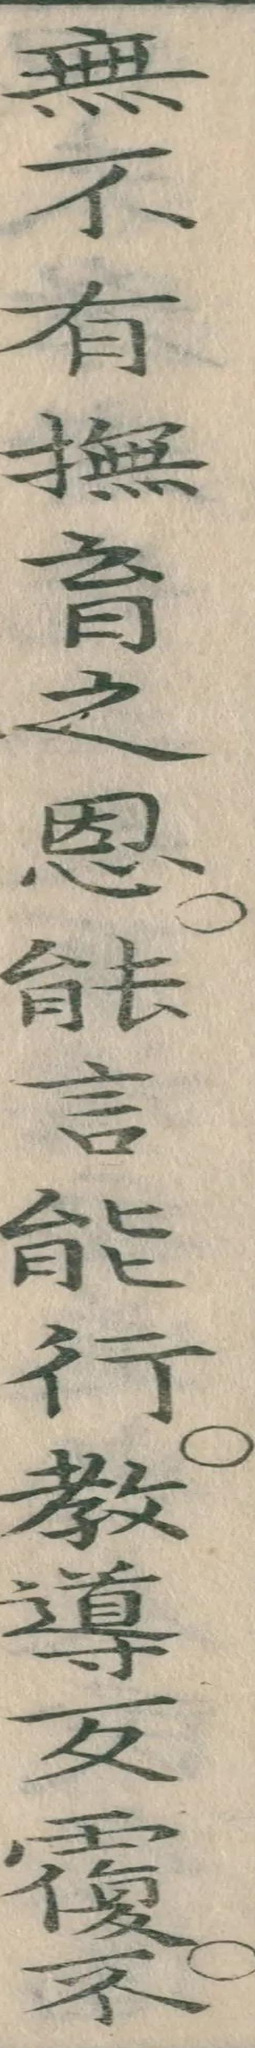無不有撫育之恩。能言能行。教導反覆。不
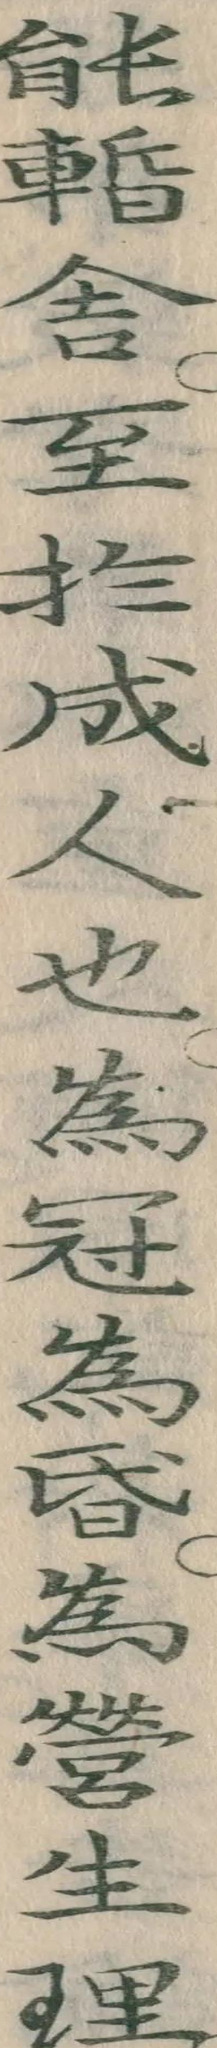能暫舎。至於成人也。為冠為昏。為営生理。
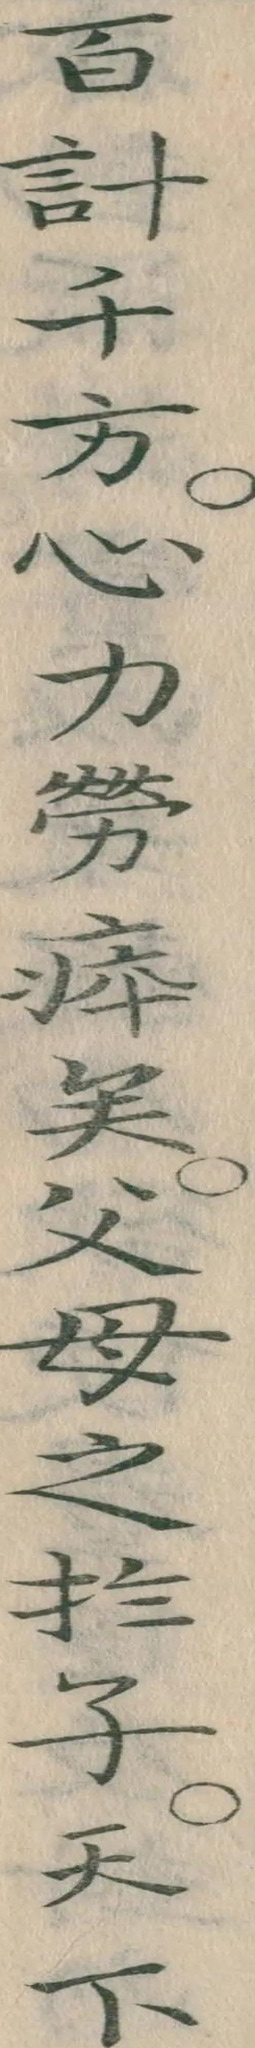百計千方。心力労矣。父母之於子。天下
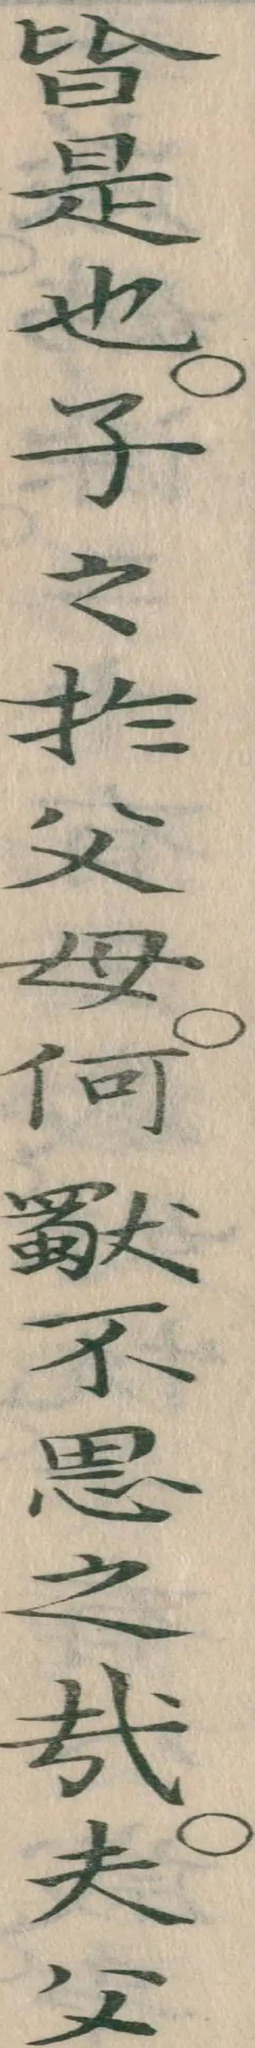皆是也。子之於父母。何不思之哉。夫父
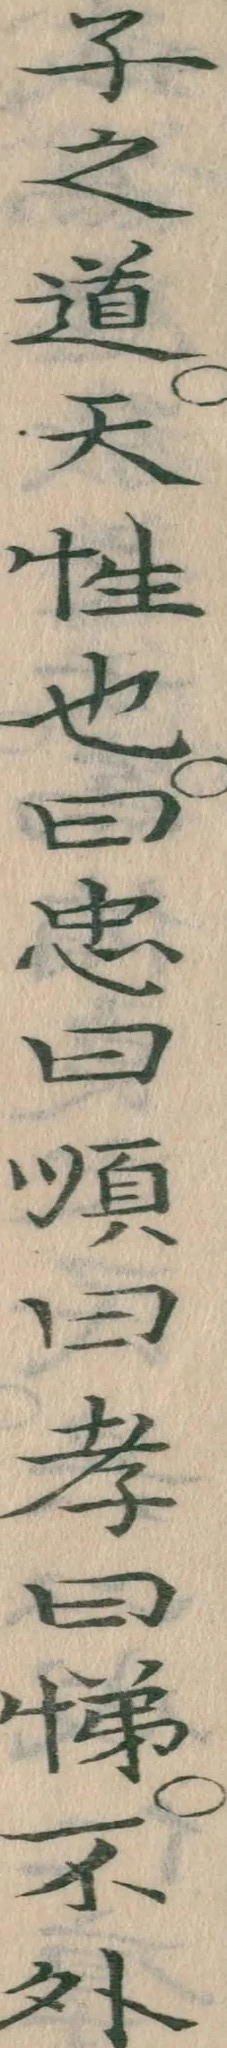子之道。天性也曰忠曰順曰孝曰悌。不外
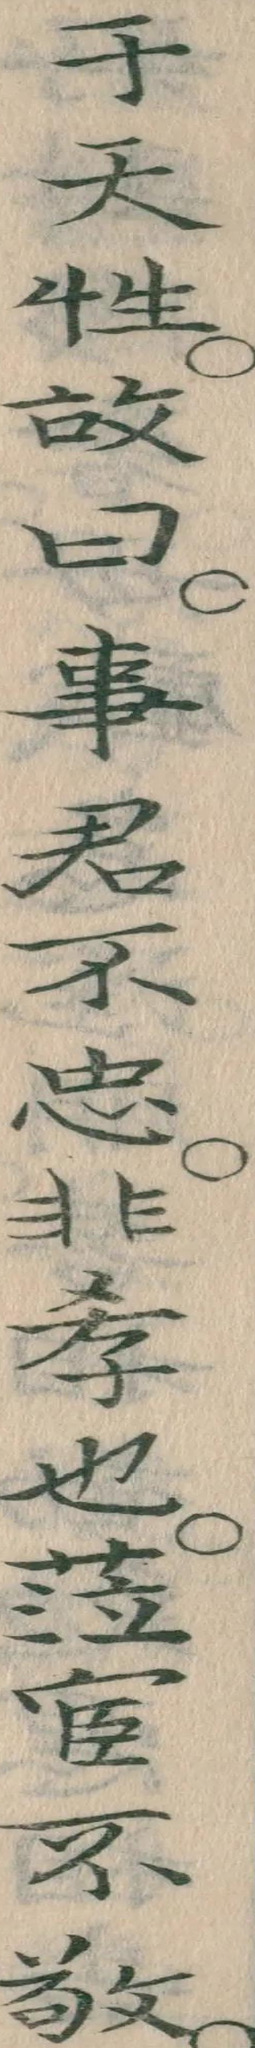于天性。故曰。事君不忠。非孝也。宦不敬。
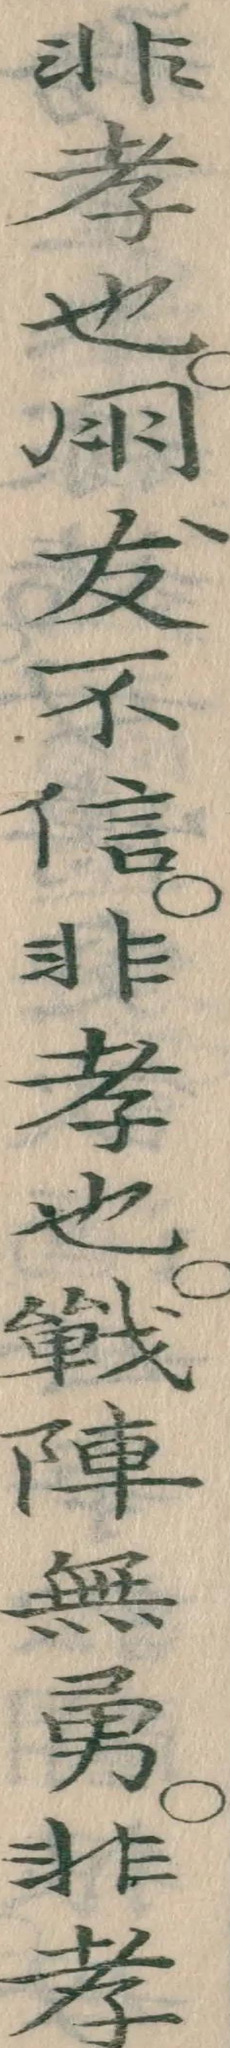非孝也。朋友不信。非孝也。戦陣無勇。非孝
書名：輪池叢書. 12
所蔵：国立国会図書館 National Diet Library, JAPAN
